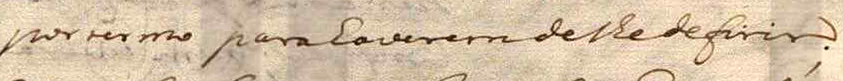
por termo para haverem de lhe defirir;
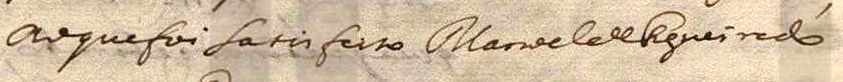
ao que foi satisfeito Manoel de Fegueiredo
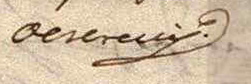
o escreuy.
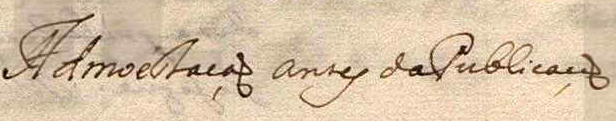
Admoestaçaõ antes da Publicaçaõ
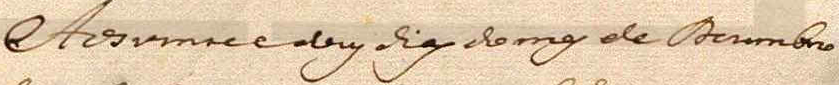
Aos vinte e dous dias do mes de Dezembro
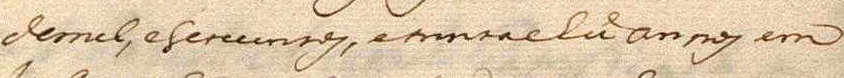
de mil, e setecentos, e trinta e hū annos em
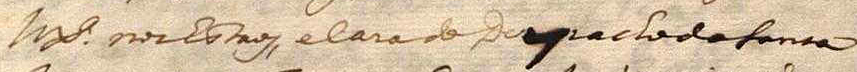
lix.a nos Estaos, e Caza do Despacho da santa
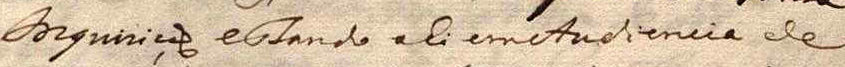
Inquiziçaõ estando ahi em Audiencia de
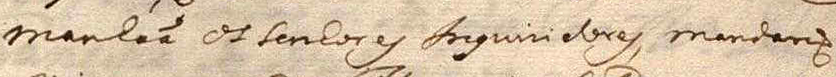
manhaã os senhores Inquizidores, mandaraõ
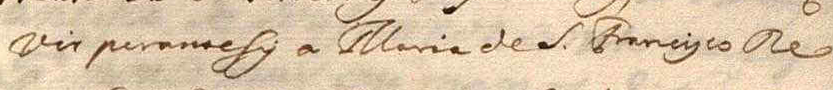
vir perante sy a Maria de S. Francisco Re
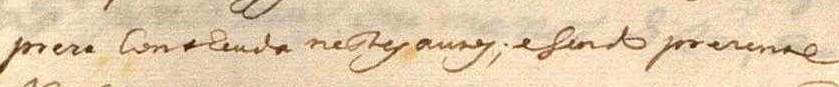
preza contheuda nestes autos; e sendo prezente
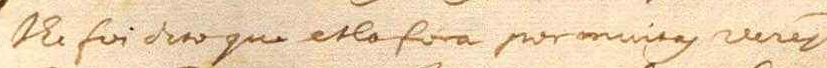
lhe foi dito que ella fora por muitas vezes
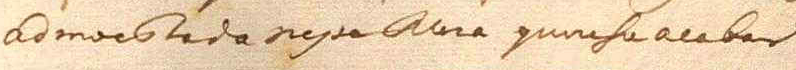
admoestada nesta Meza quizesse acabar
